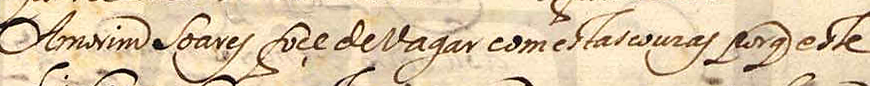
Amorim Soares foçe devagar com estas couzas porq̄ este
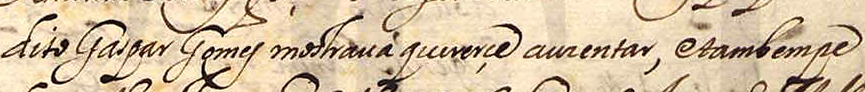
dito Gaspar Gomes mostraua quererçe auzentar, e tambem pe
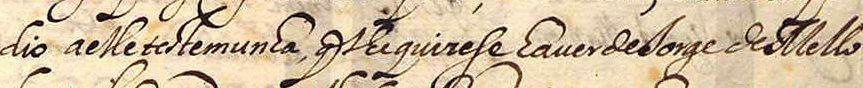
dio a elle testemunha, q̄ lhe quizese hauer de Jorge de Mello
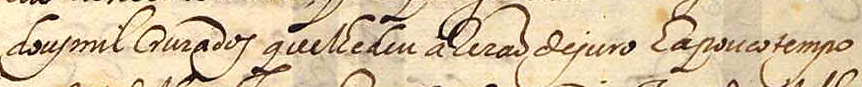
dous mil cruzados que lhe deu a Rezaõ de juro ha pouco tempo
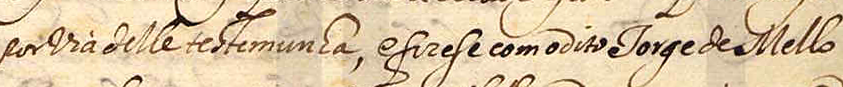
por via delle testemunha, e fizese com o dito Jorge de Mello
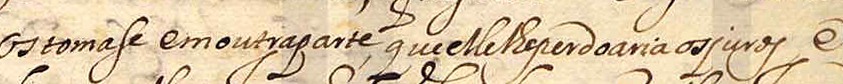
os tomase em outra parte, que elle lhe perdoaria os juros e
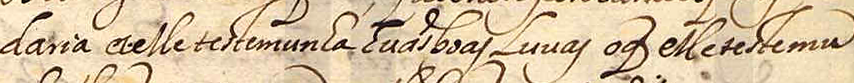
daria a elle testemunha huās boas Luuas o q̄ elle testemu
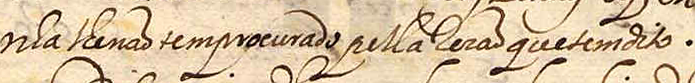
nha lhe naõ tem procurado pella Rezaõ que tem dito.
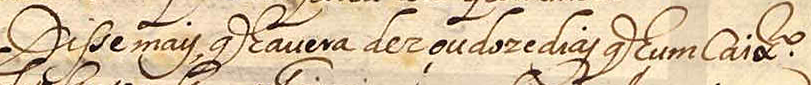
Disse mais, q̄ hauera dez ou doze dias q̄ hum caixro.
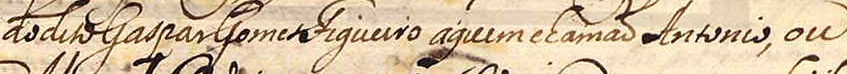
do dito Gaspar Gomes Figueiro a quem chamaõ Antonio, ou
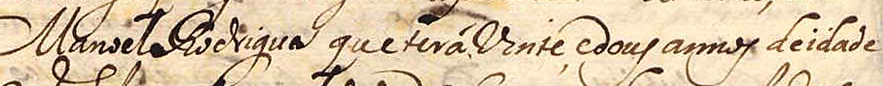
Manoel Rodrigues que terá vinte, e dous annos de idade
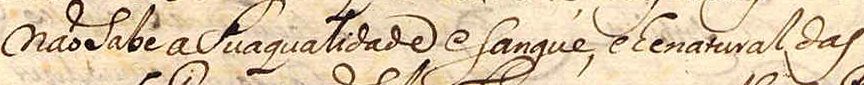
naõ sabe a sua qualidade e sangue, e he natural das
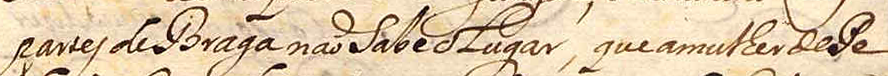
partes de Braga, naõ sabe o Lugar, que a mulher de Pe
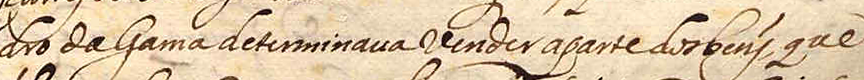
dro da Gama determinaua vender a parte dos ben̄s, que
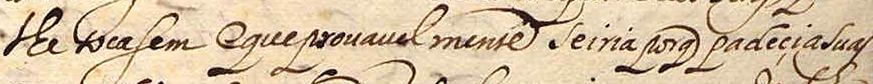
lhe tocasem e que prouauelmente se iria porq̄ padecia suas
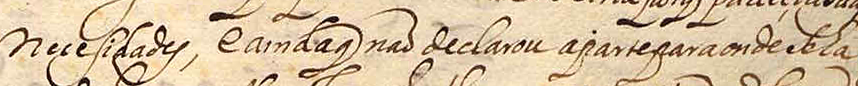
necesidades, e ainda q̄ naõ declarou a parte para onde se ha
